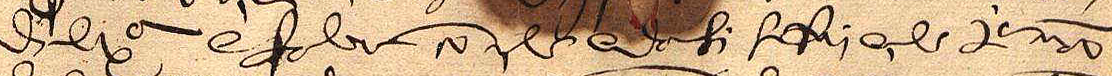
de lxa e falou cō ele e dahi se foj ele ta não
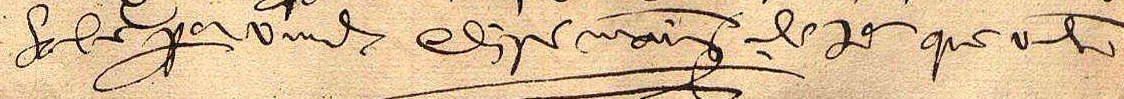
sabe ꝑa vmde e dise mais ele ta que o ħo
